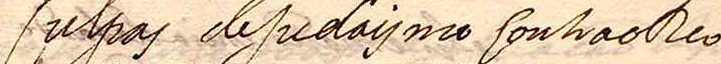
Culpas de Judajsmo Contra o Reo
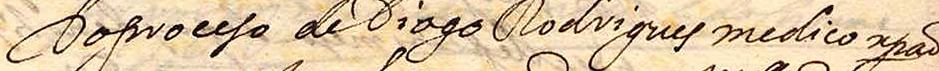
Do proceso de Diogo Rodrigues medico xpão
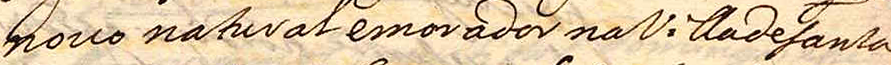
nouo natural e morador na Villa de santa
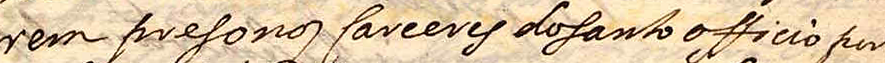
rem preso noz Carceres do santo officio por
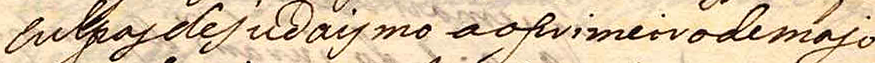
culpas de judajsmo ao primeiro de majo
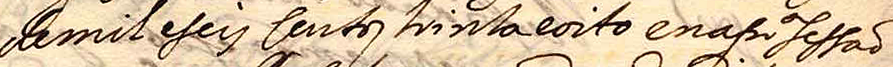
de mil e seiscentoz trinta e oito e na pra sessaõ
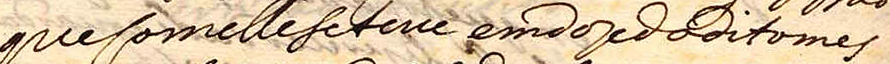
que Com elle se teue em doze do dito mes
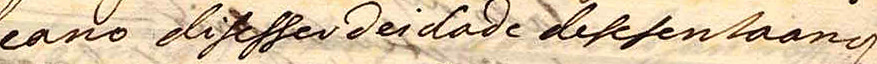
e ano dise sser de idade de sesenta anoz
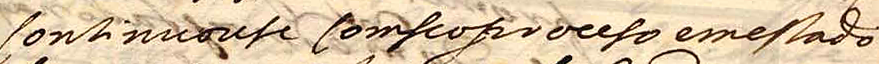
Continuouse com seo proceso em estado
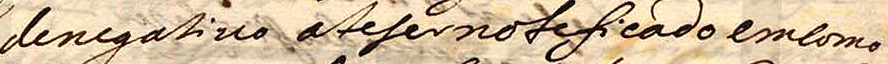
de negatiuo ate ser noteficado em como
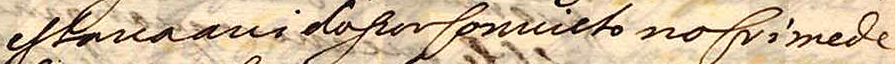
estaua auido por Conuicto no Crime de
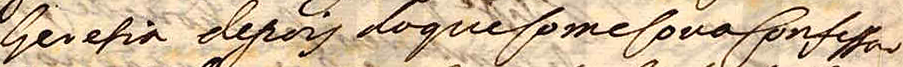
heresia depois do que ComeCou a Confessar
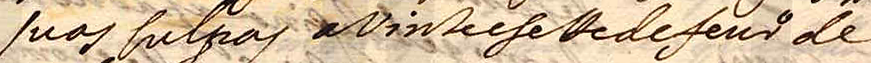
suas Culpas a vinte e sette de feuro de
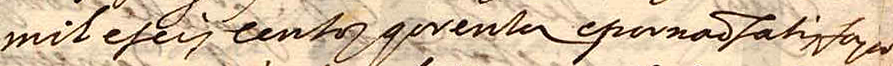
mil e seiscentoz qorenta e por naõ satisfazer
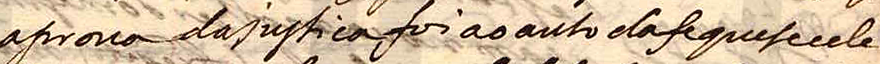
a proua da justica foi ao auto da fe que se cele
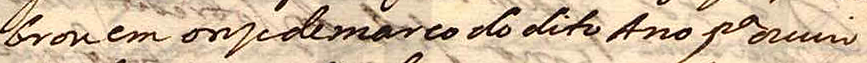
brou em onze de marco do dito Ano par ouuir
